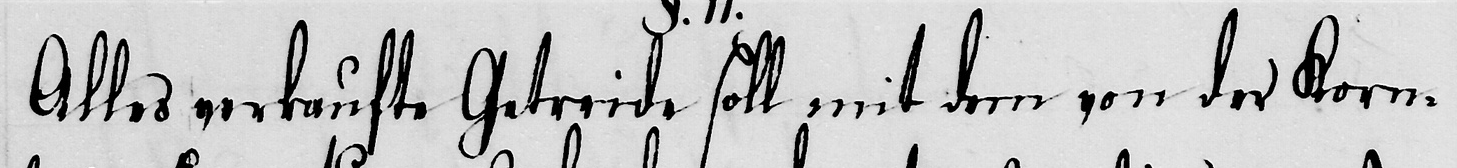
Alles verkaufte Getreide soll mit dem von der Korn¬
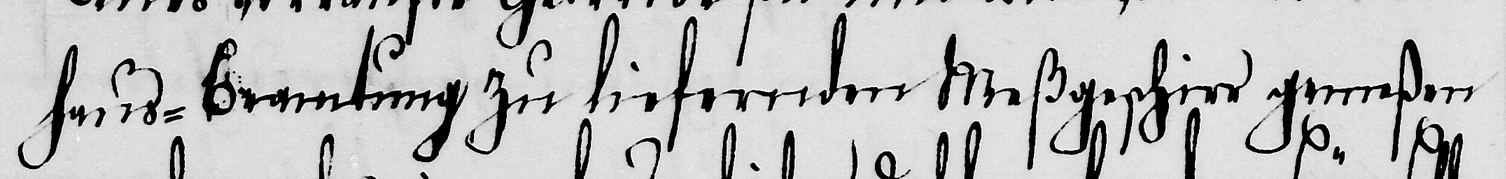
haus-Beamtung zu liefernden Maßgeschirr gemeßen
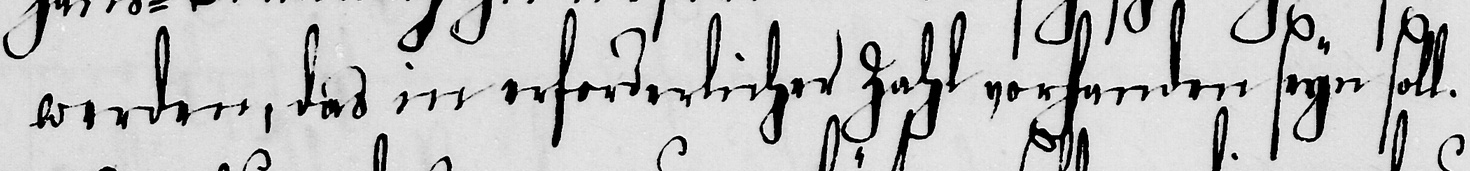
werden, das in erforderlicher Zahl vorhanden seyn sol¬
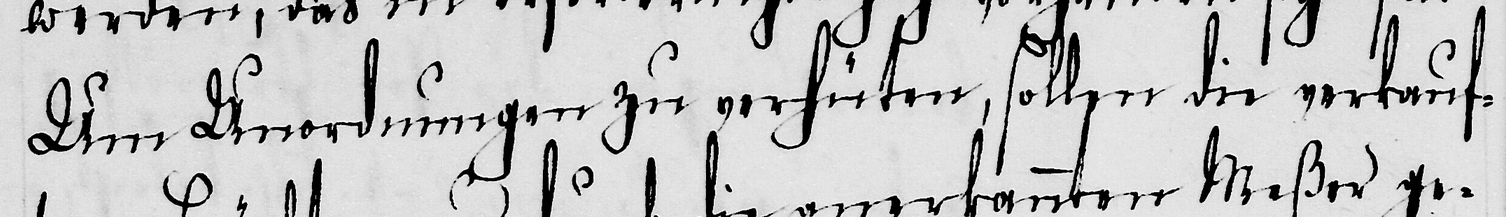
Um Unordnungen zu verhüten, sollen die verkauf¬
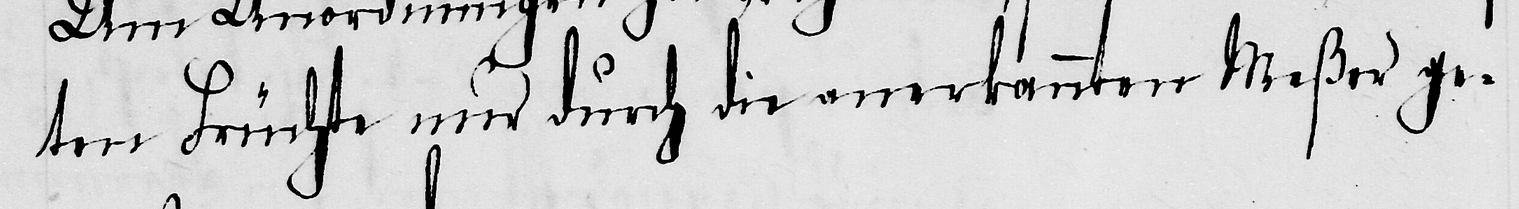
ten Früchte nur durch die anerkannten Meßer ge¬
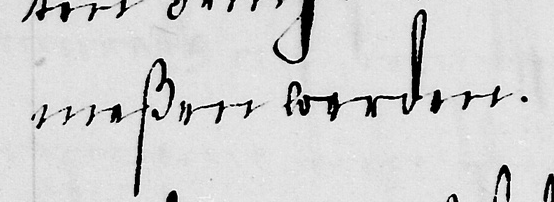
meßen werden.
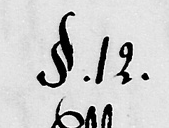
§.12.
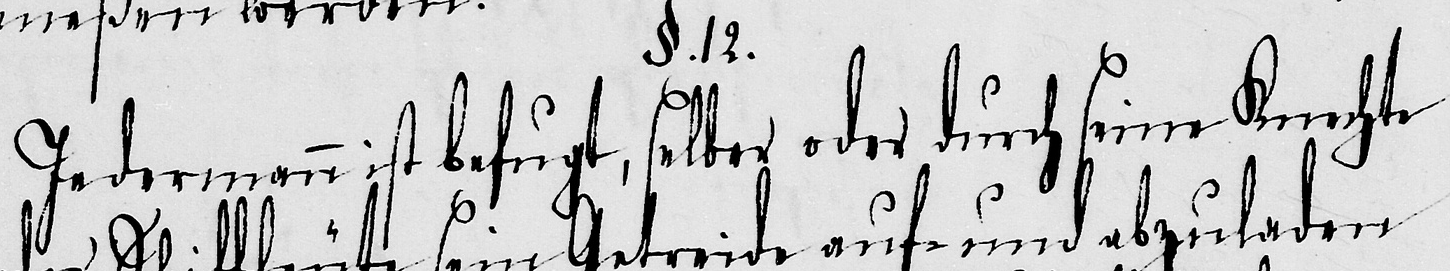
Jedermann ist befugt, selber oder durch seine Knechte
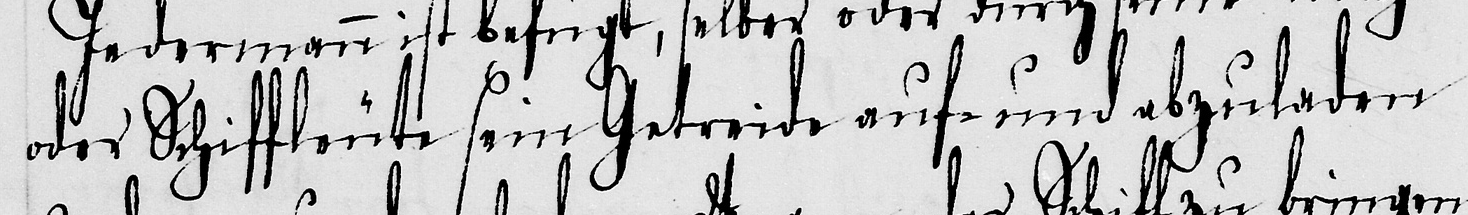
der Schiffleute sein Getreide auf- und abzuladen
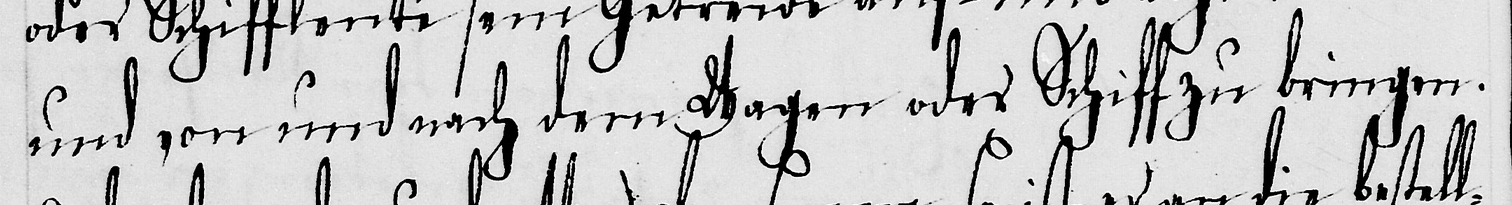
und von und nach dem Wagen oder Schiff zu bringen.
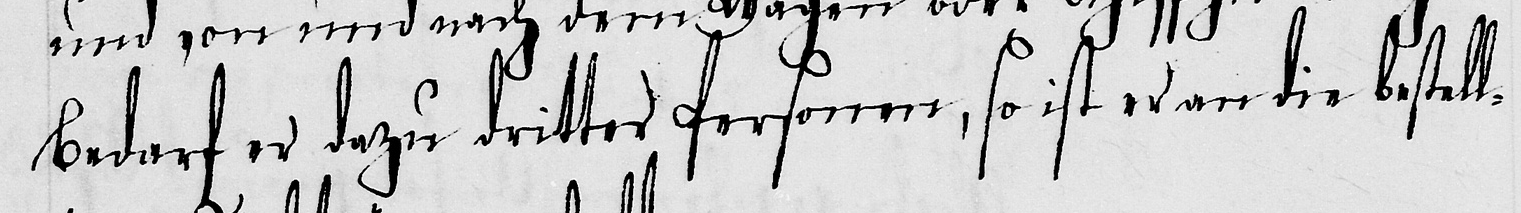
Bedarf er dazu dritter Personen, so ist er an die bestel¬
